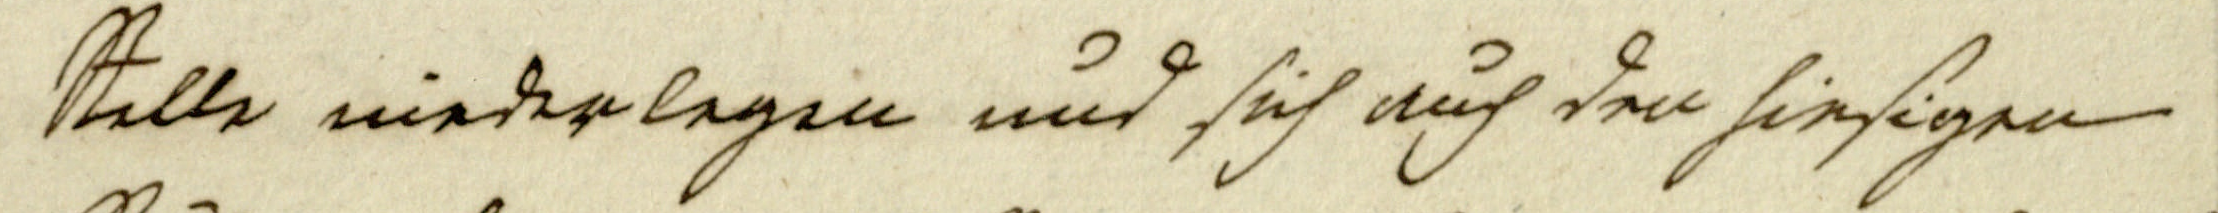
Stelle niederlegen und sich auch den hiesigen
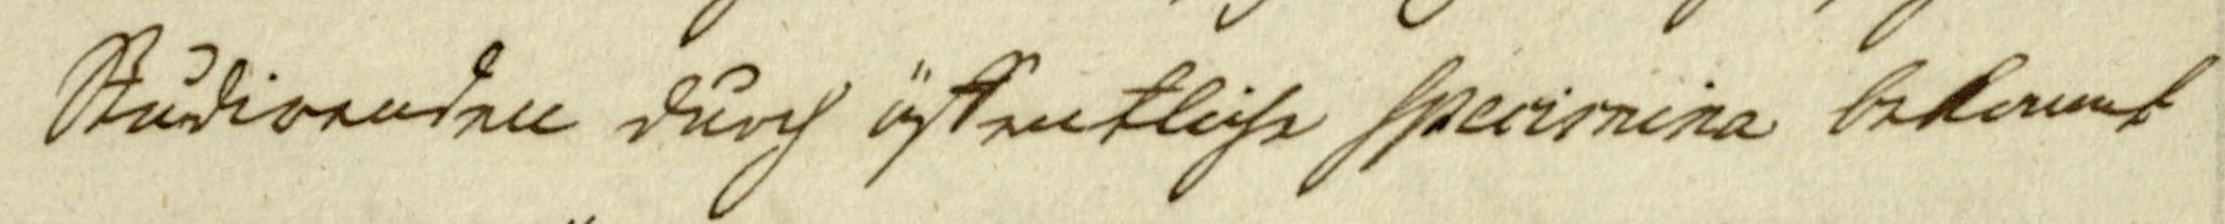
Studirenden durch öffentliche specimina bekannt
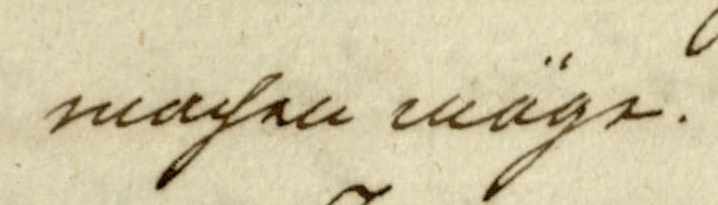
machen möge.
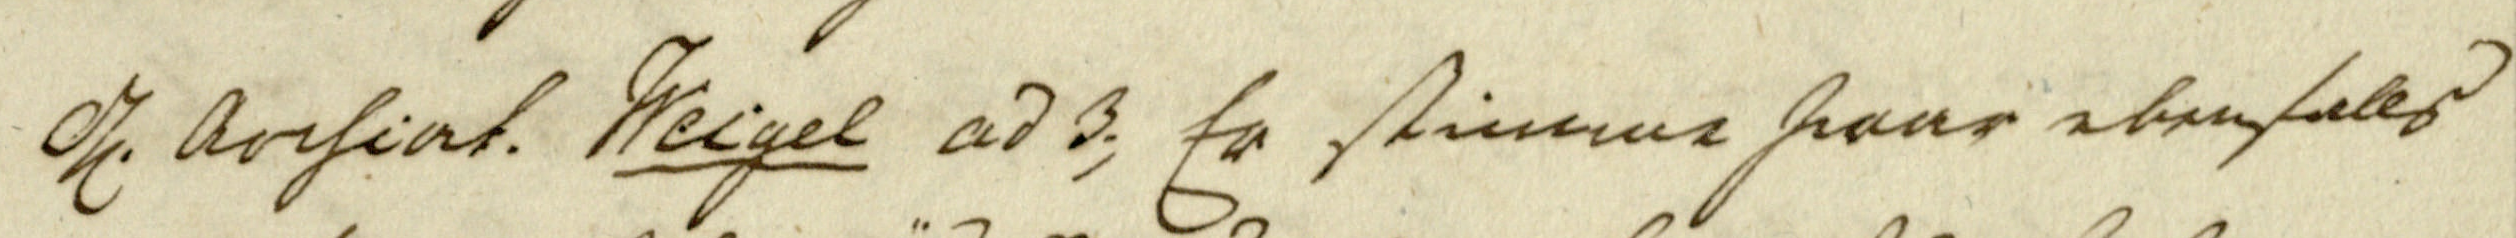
dh. Archiat. Weigel ad 3., Er stimme zwar ebenfalls
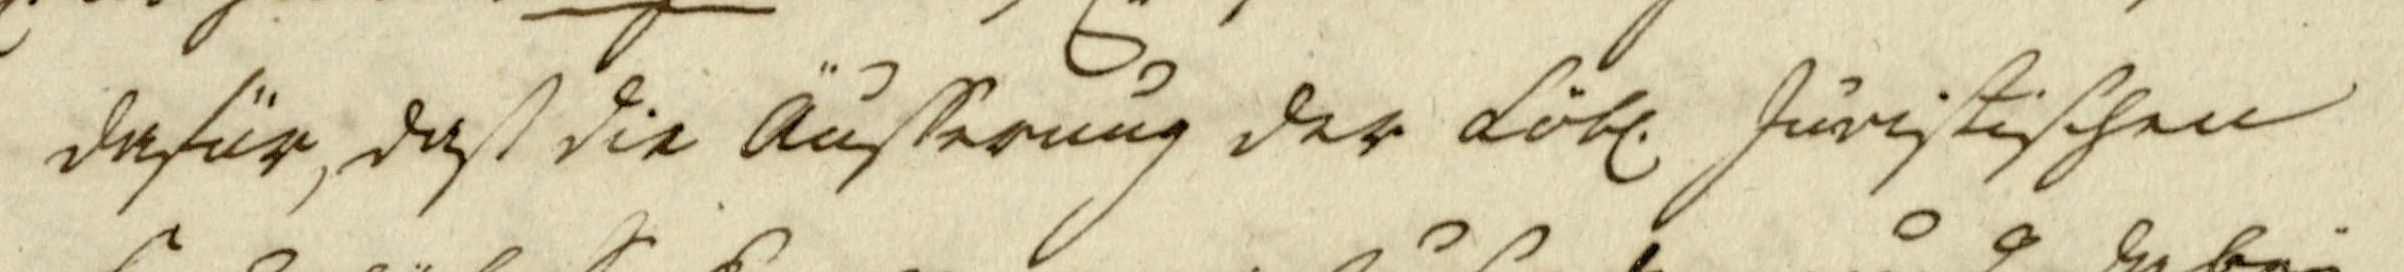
dafür, daß die Äusserung der Löbl. Juristischen
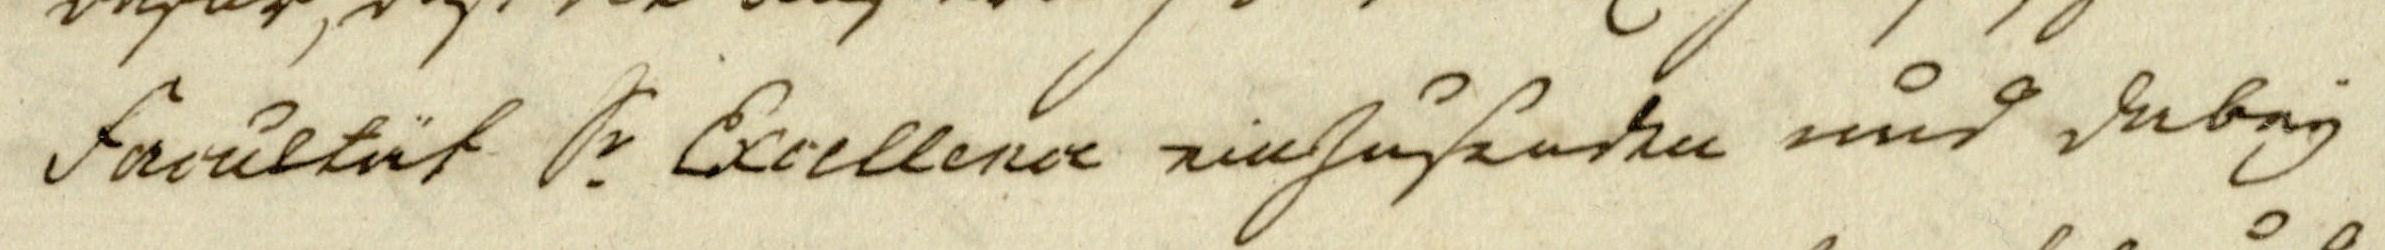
Facultät Sr. Excellence einzusenden und dabeÿ
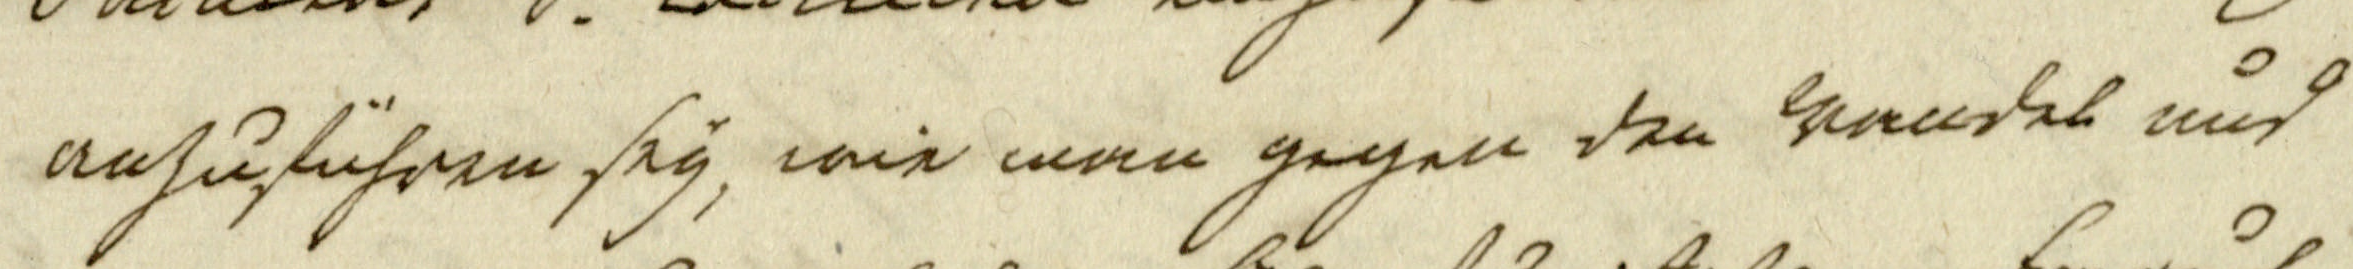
anzuführen seÿ, wie man gegen den Wandel und
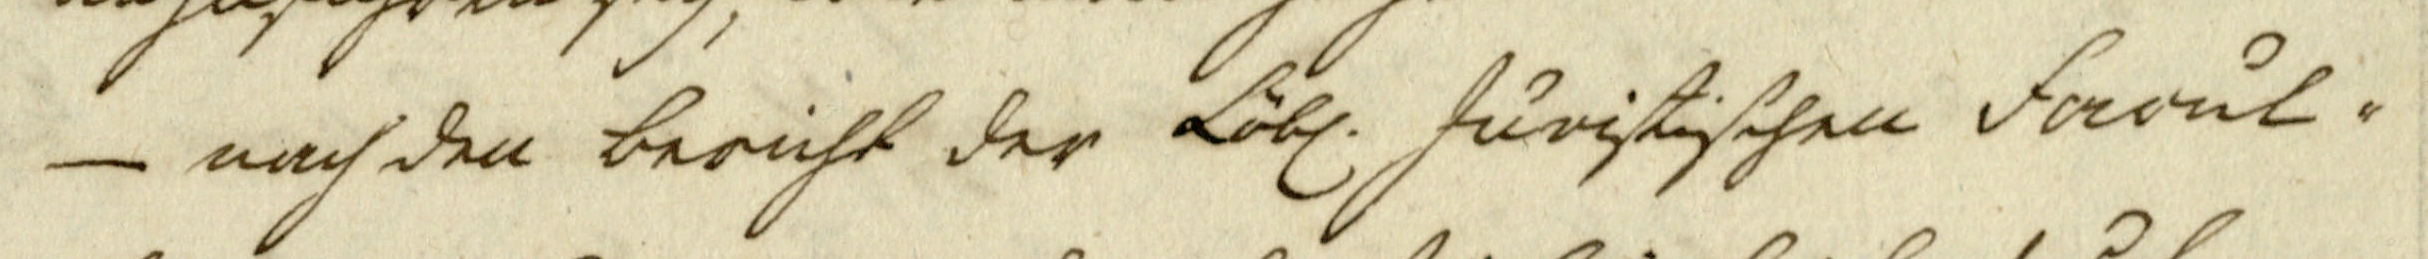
nach den Bericht der Löbl. Juristischen Facul¬
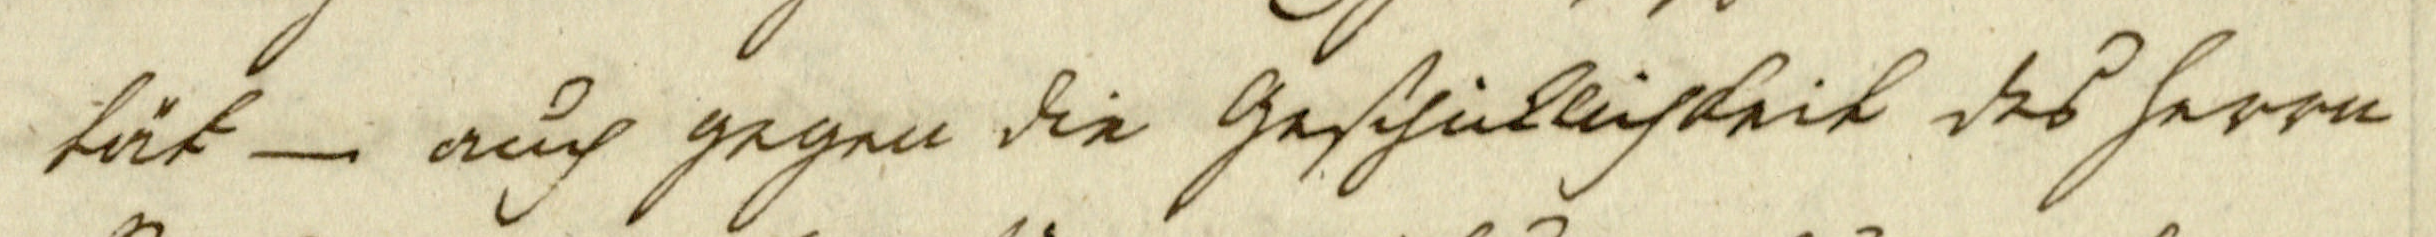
tät auch gegen die Geschicklichkeit des herrn
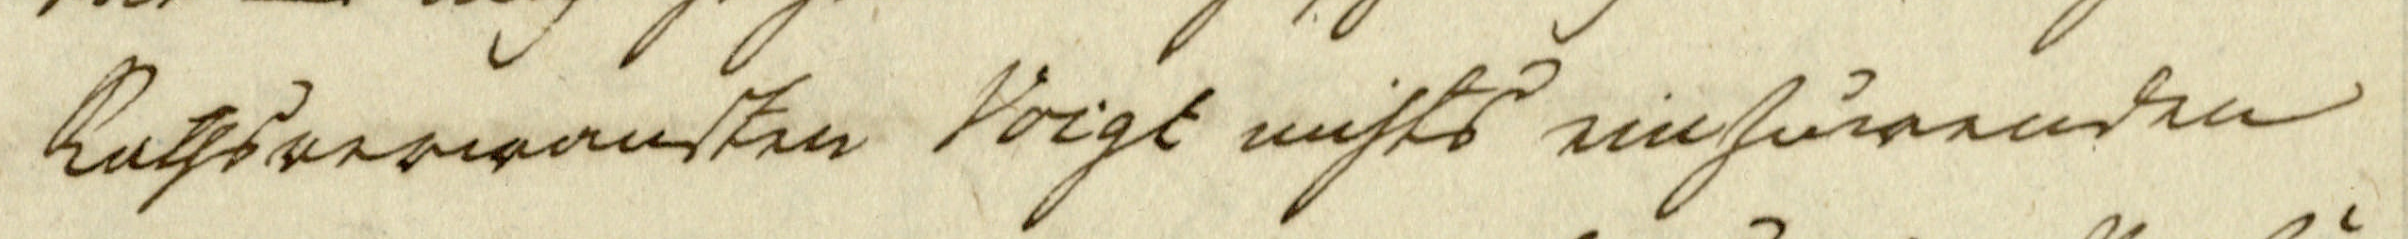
Rathsverwandten Voigt nichts einzuwenden
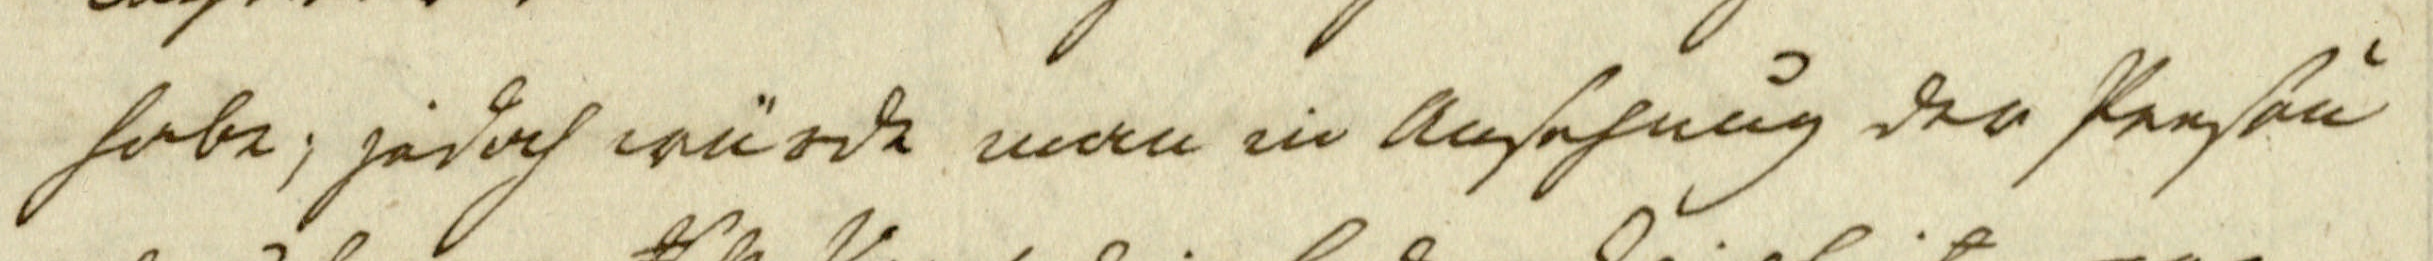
habe, jedoch würde man in Ansehung der Person
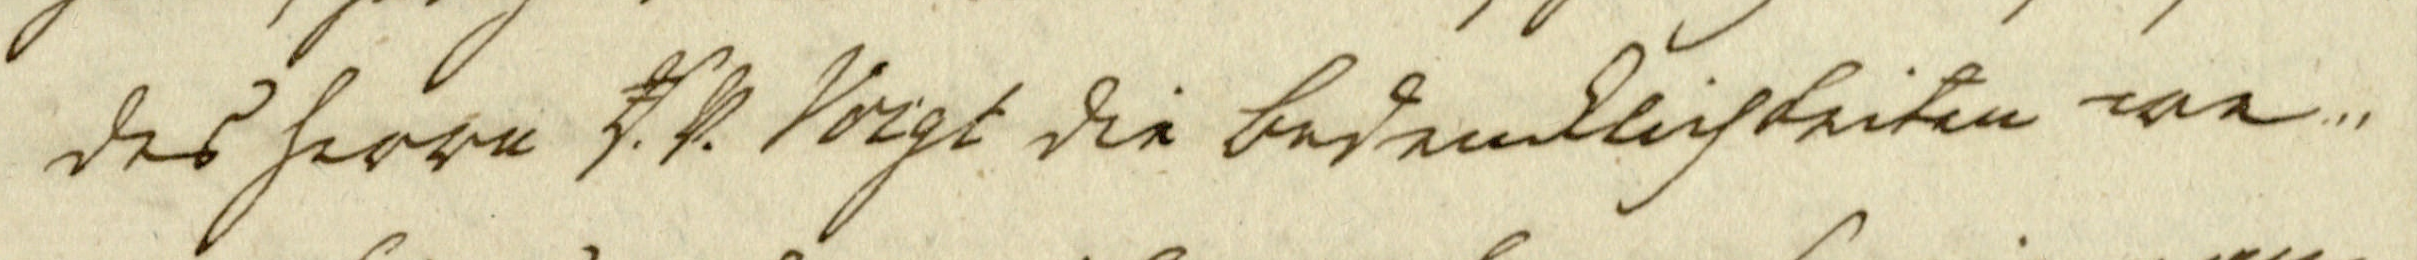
des herrn R. V. Voigt die Bedencklichkeiten we¬
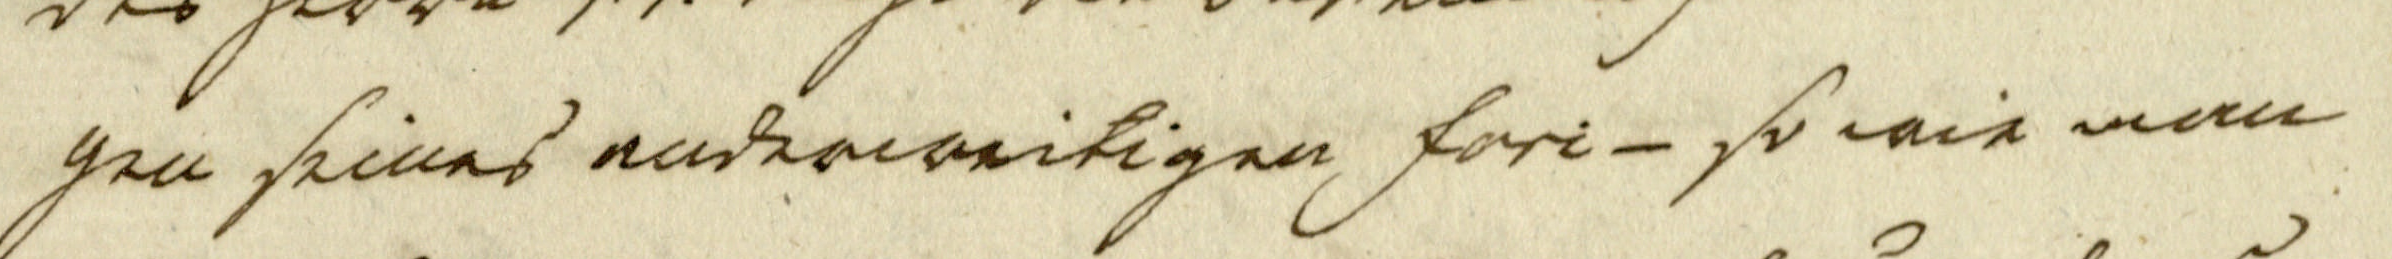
gen seines anderweitigen Fori so wie man
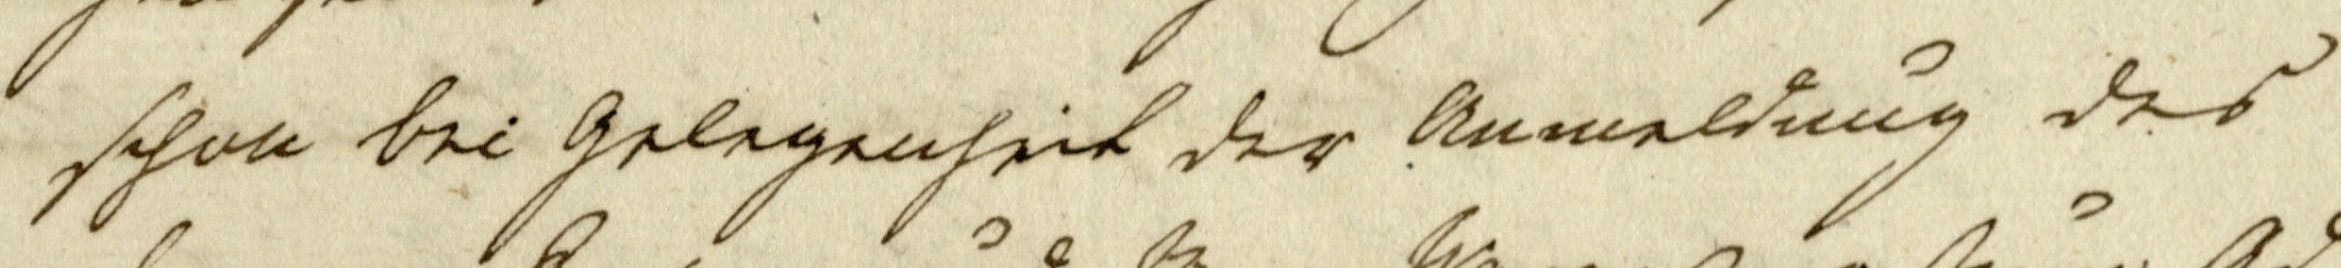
schon bei Gelegenheit der Anmeldung des
